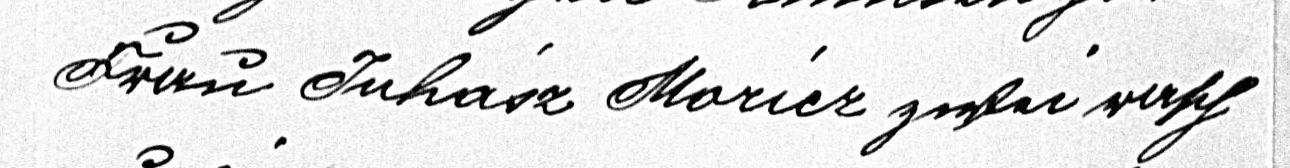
Frau Juhász Moricz zwei rasch
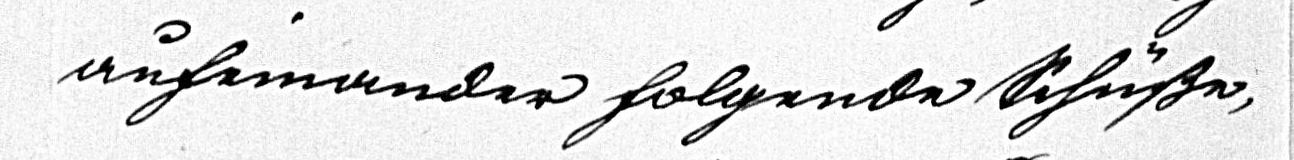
aufeinander folgende Schüße,
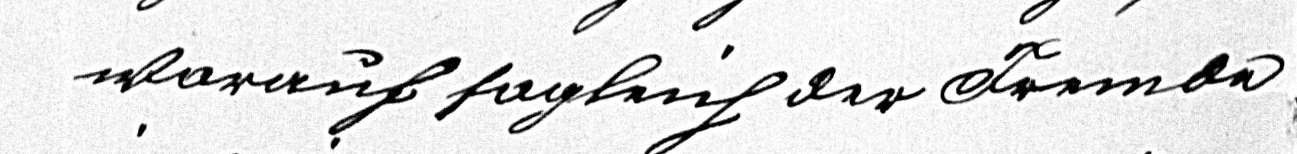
worauf sogleich der Fremde
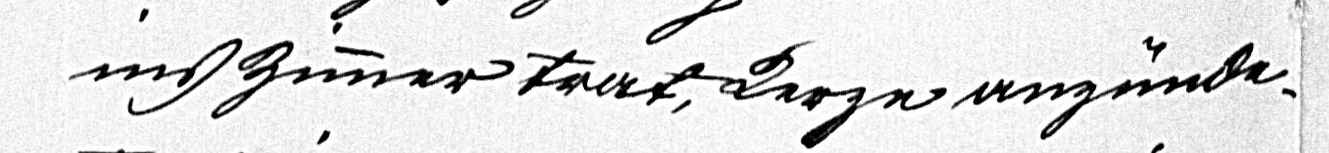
ins Zimmer traf, Kerze anzünde¬
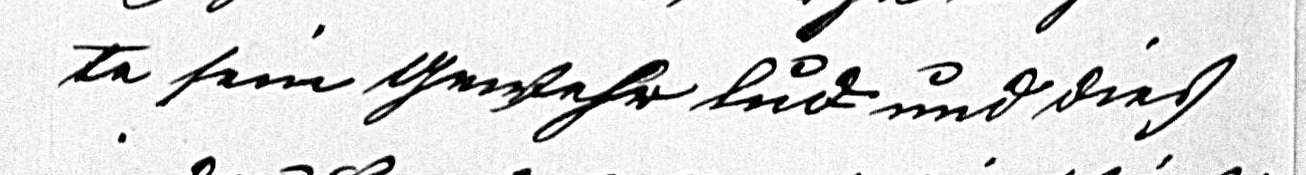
te sein Gewehr lud und dies
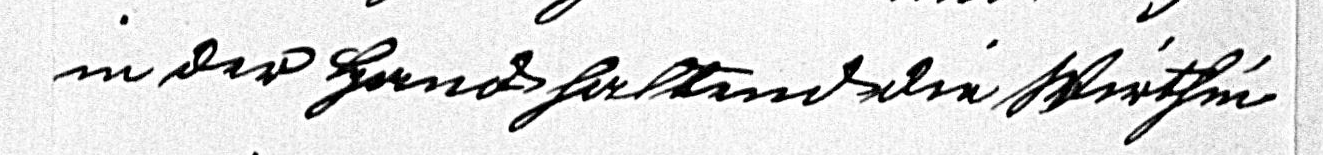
in der Hand haltend die Wirthin
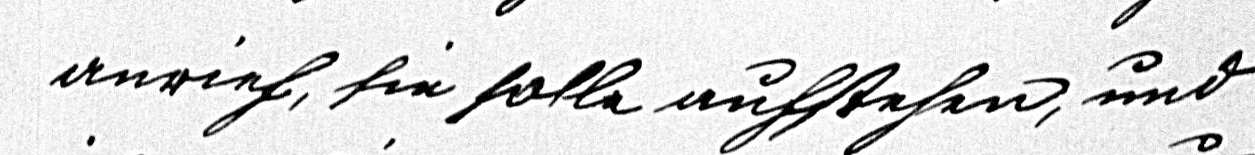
anrief, sie solle aufstehen, und
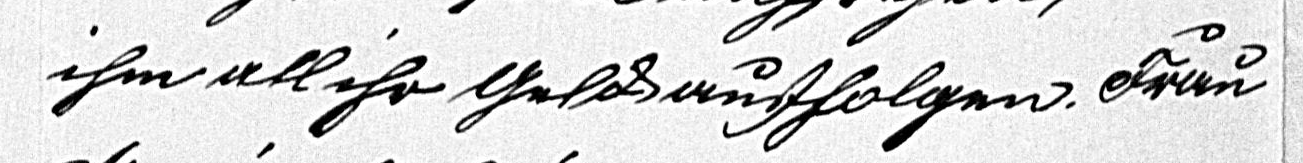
ihm all ihr Geldausfolgen. Frau
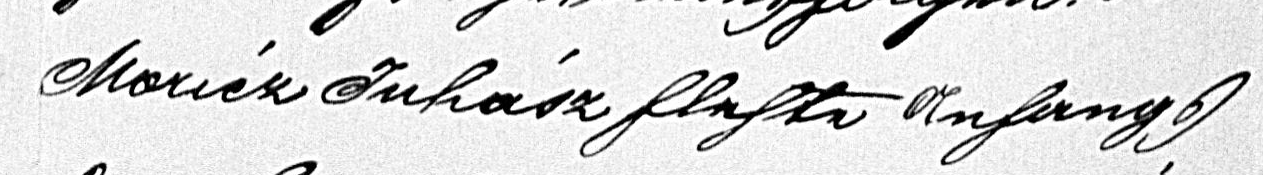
Moricz Juhász flehte Anfangs
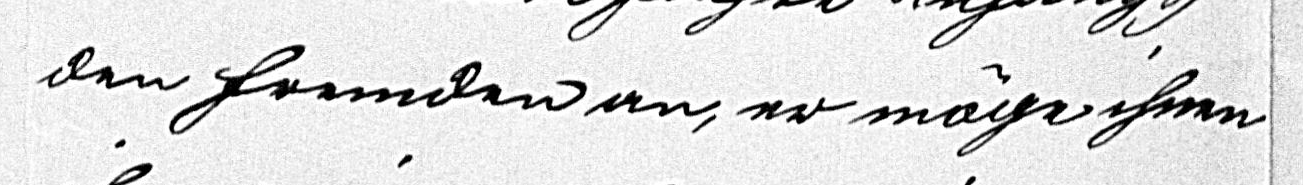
den Fremden an, er möge ihnen
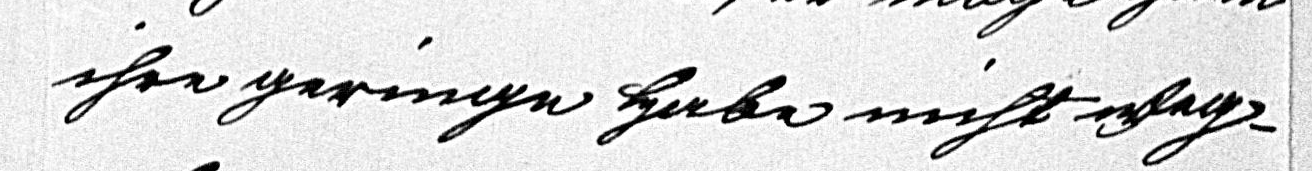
ihre geringe Habe nicht weg¬
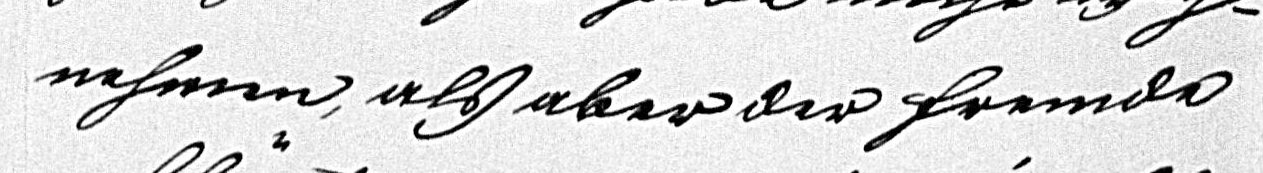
nehmen, als aber der fremde
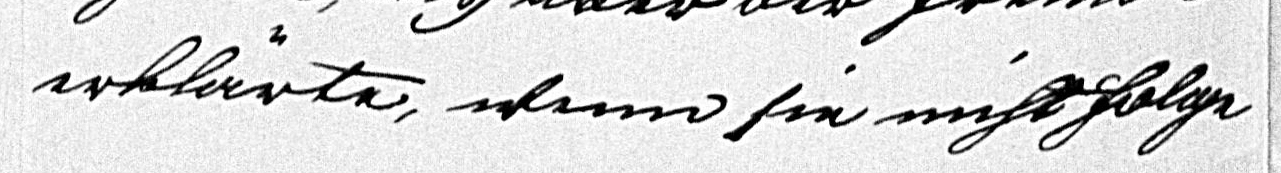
erklärte, wenn sie nicht folge
